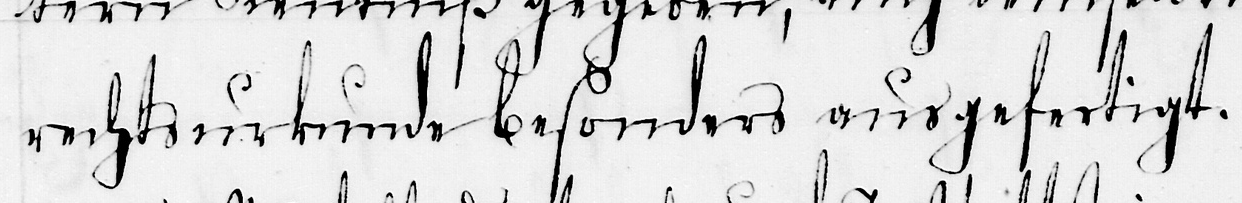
rechtsurkunde besonders ausgefertigt.
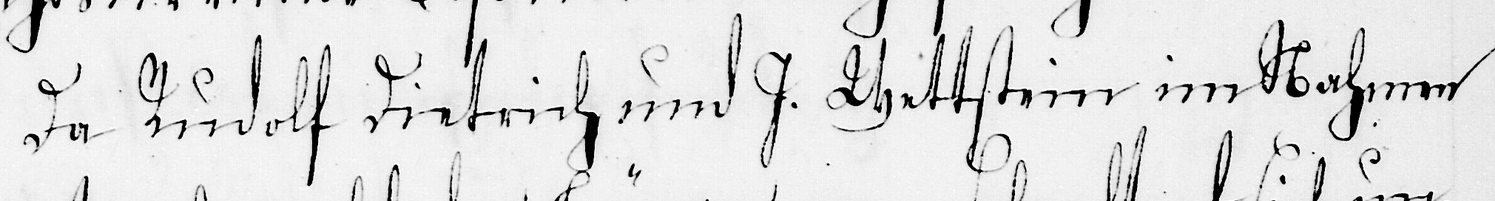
Da Rudolf Dietrich und J. Wettstein im Nahmen
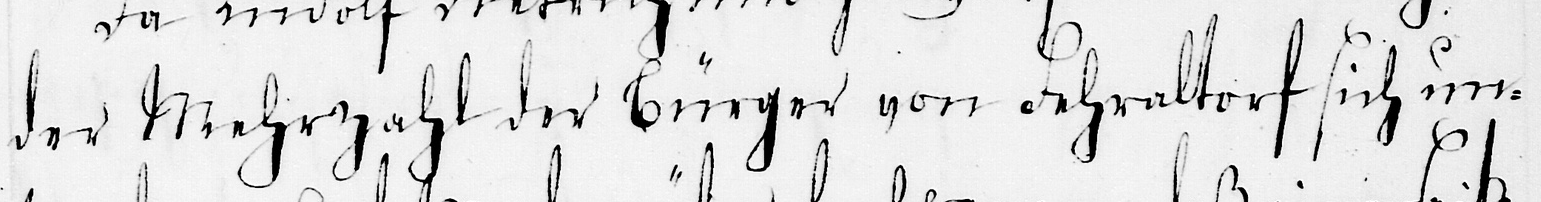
der Mehrzahl der Bürger von Fehraltorf sich un¬
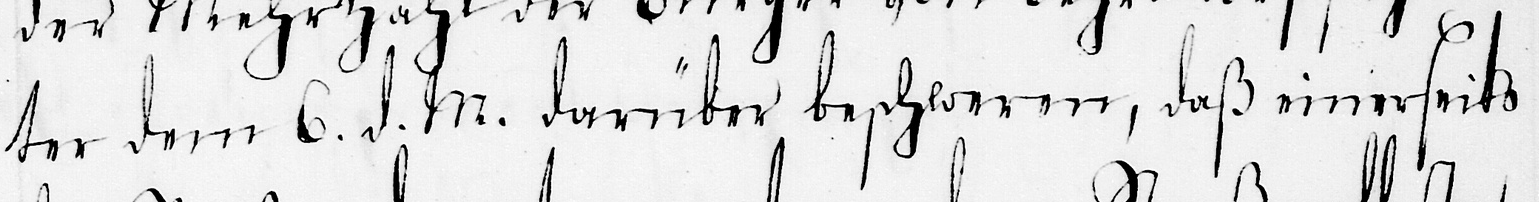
ter dem 6. d. M. darüber beschweren, daß einerseits
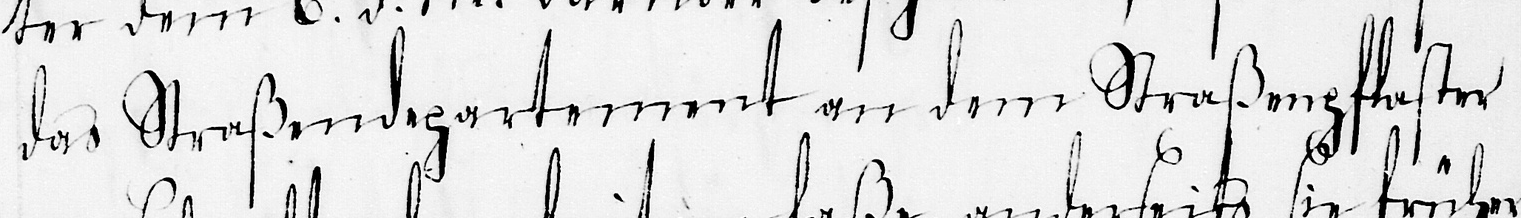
das Straßendepartement an dem Straßenpflaster
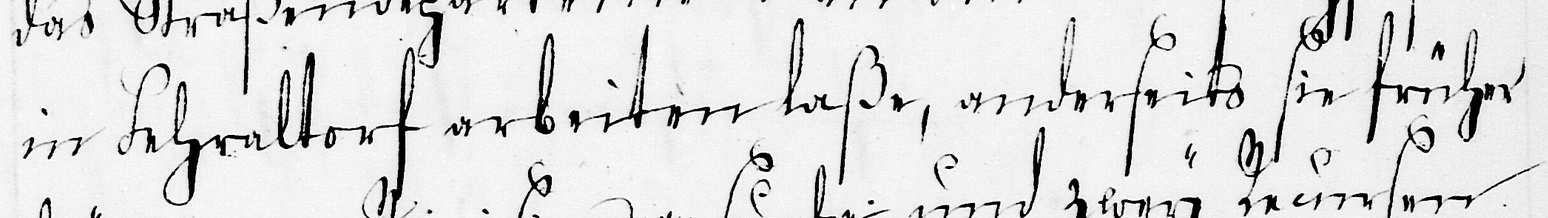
in Fehraltorf arbeiten laße, anderseits sie früher
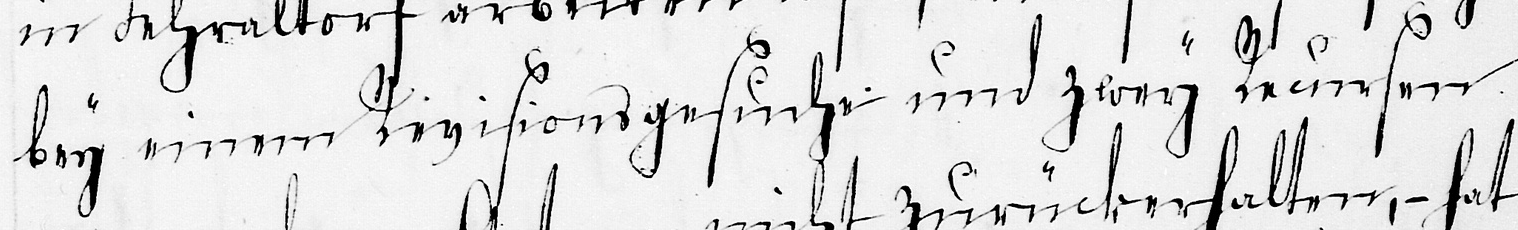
bey einem Revisionsgesuche und zwey Recursen
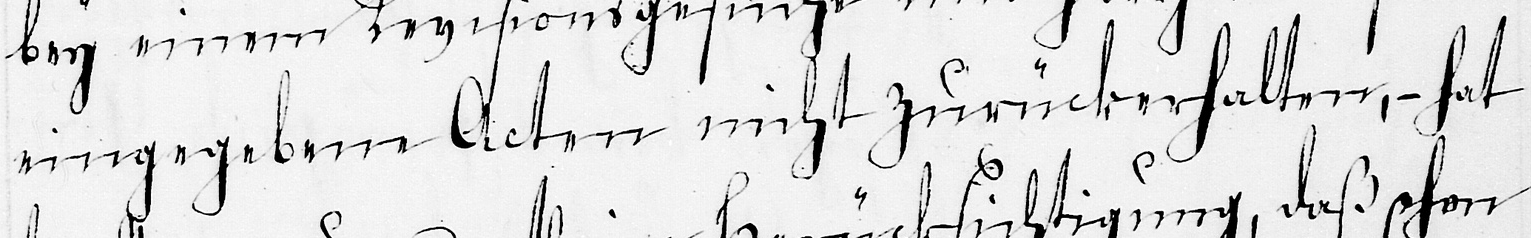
eingegebene Acten nicht zurückerhalten, – hat
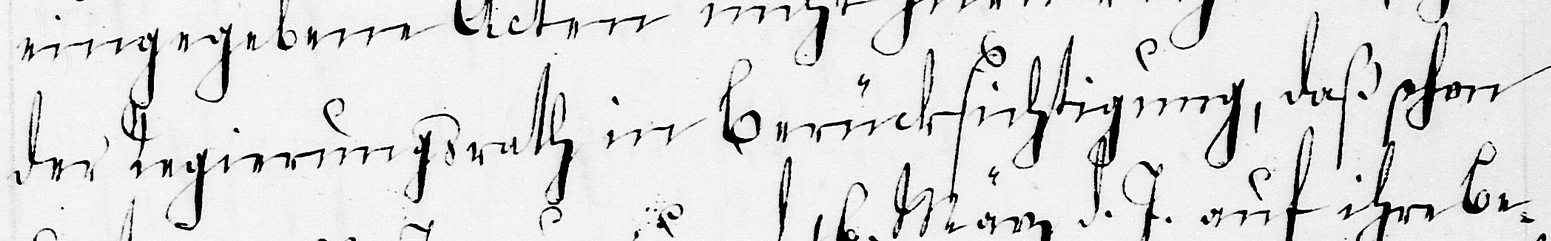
der Regierungsrath in Berücksichtigung, daß schon
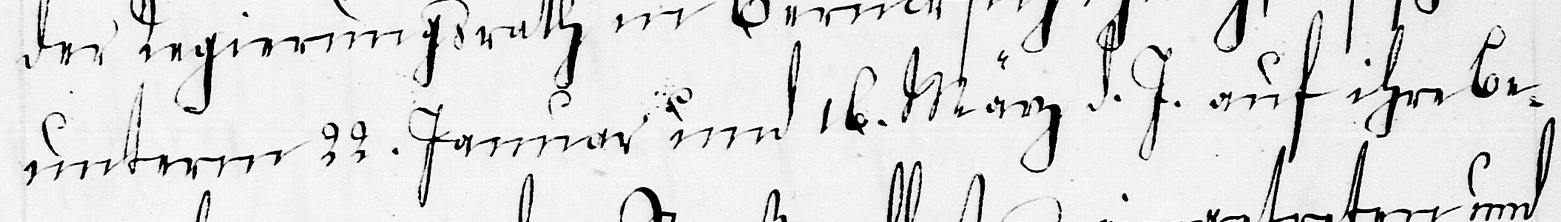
unterm 22. Januar und 16. März d. J. auf ihre Be¬
